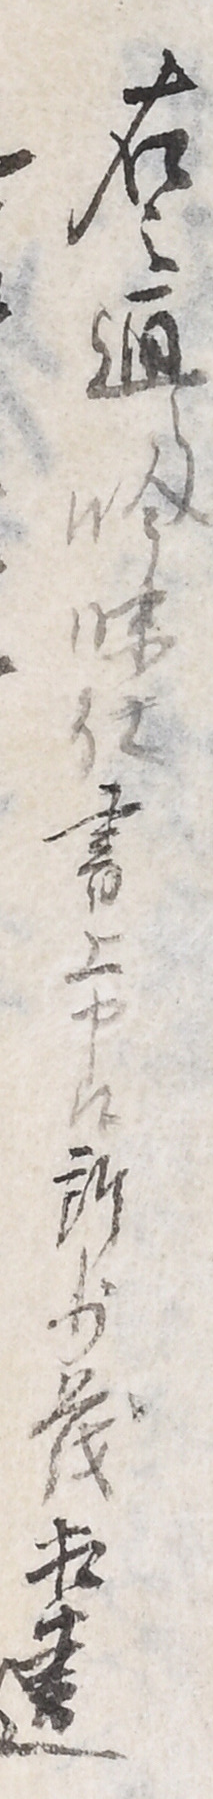右通リ吟味仕書上申候所少茂
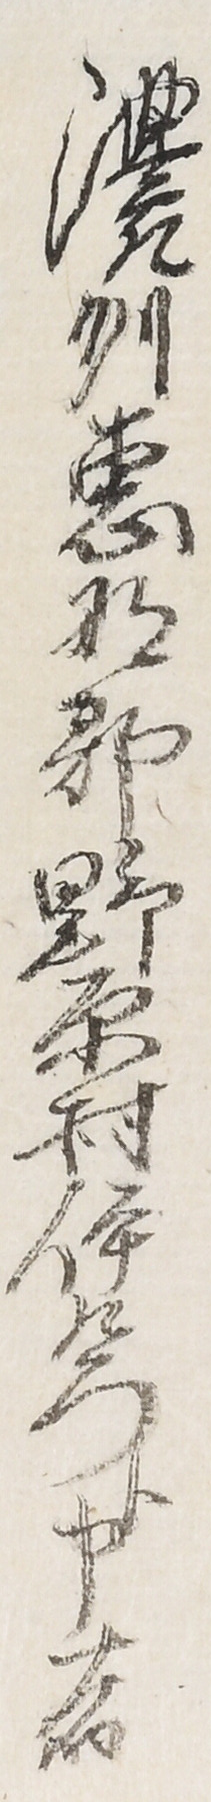濃州恵那郡野原村伊左衛門ト申者
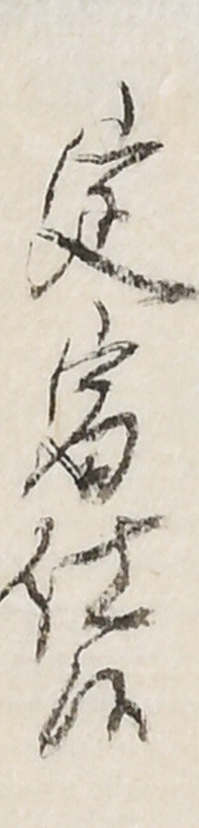定宿仕候
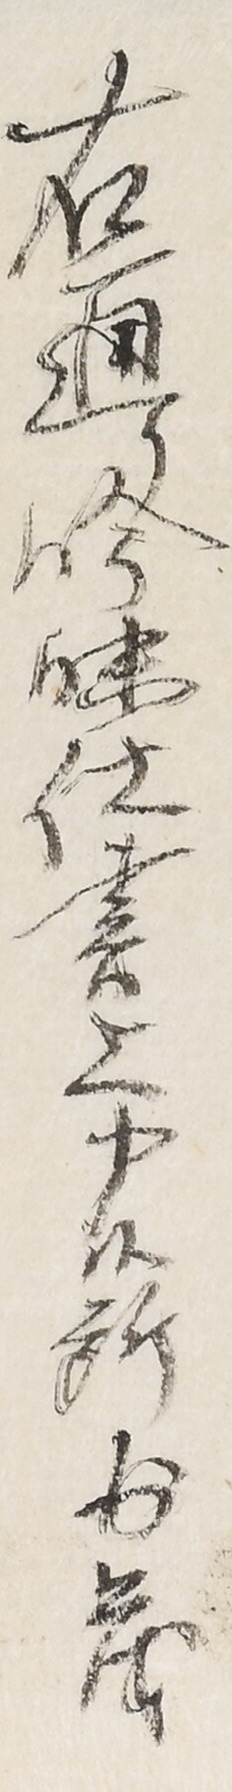右通リ吟味仕書上申候所少茂
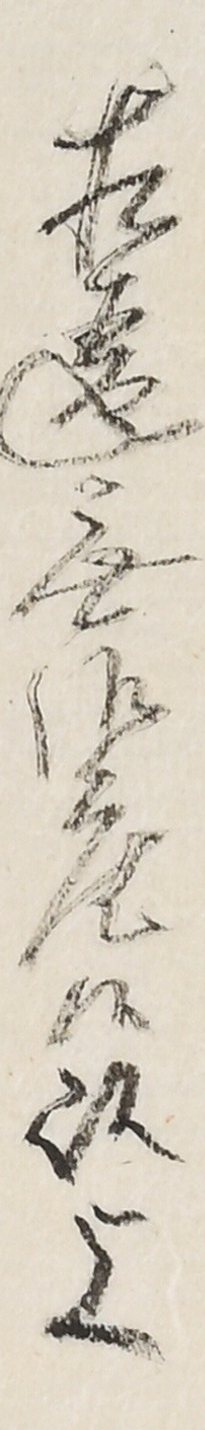相違無御座候以上
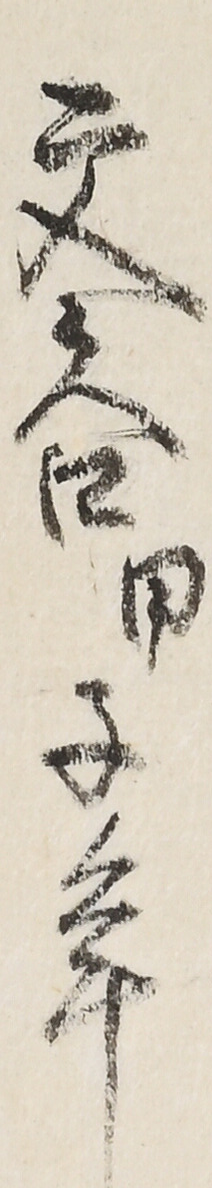文久四甲子年
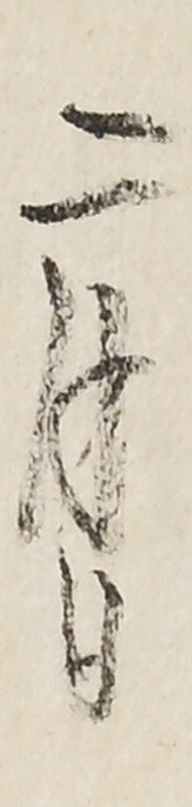二月日
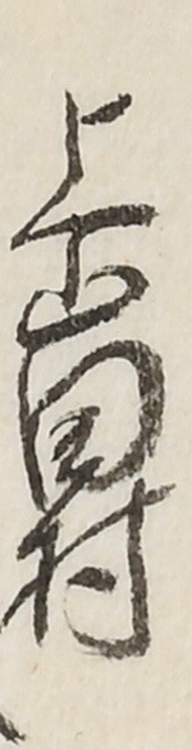上山田村
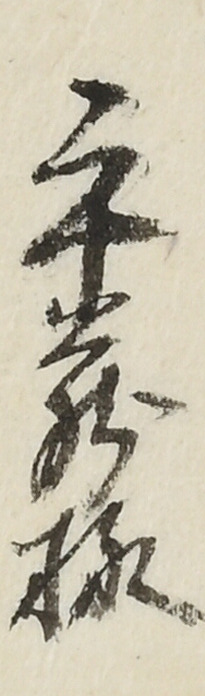平蔵様

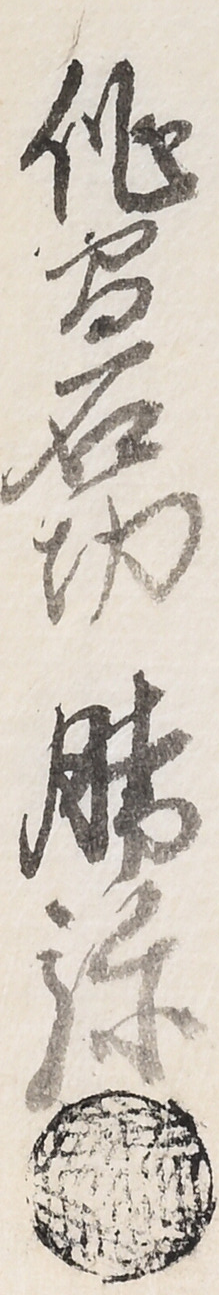作間石切勝弥㊞
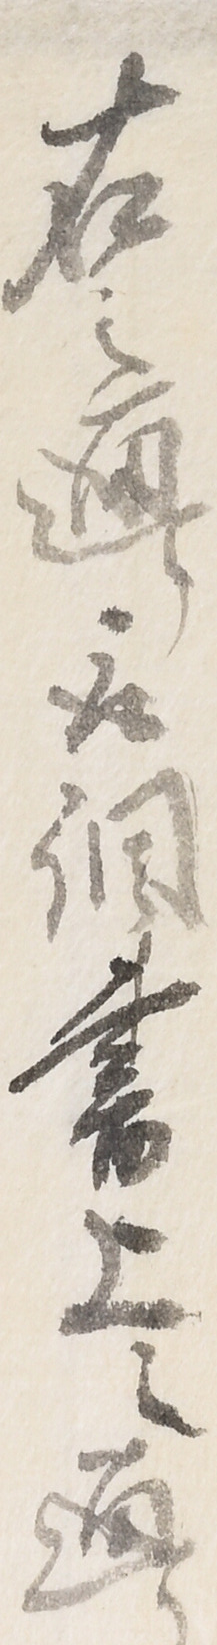右之通り取調書上之通り
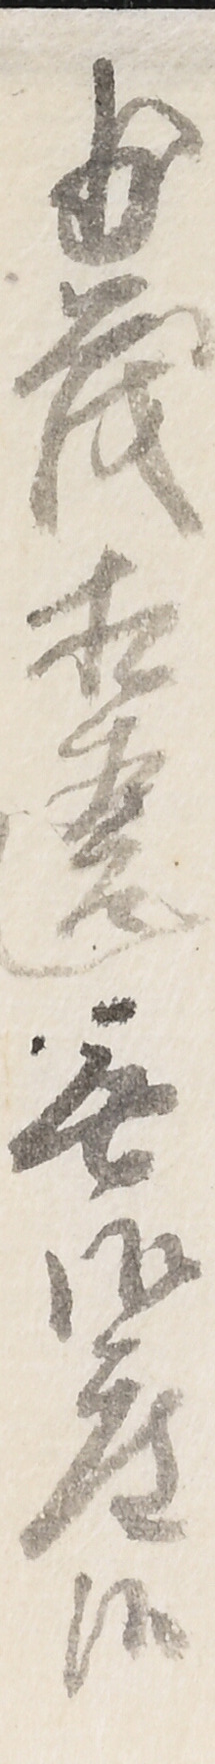少茂相違無御座候
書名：文久四甲子年二月日他国石切稼書上帳
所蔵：伊那市立高遠町図書館・合同会社AMANE
